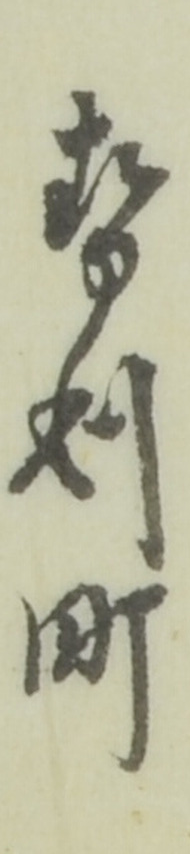勢利町
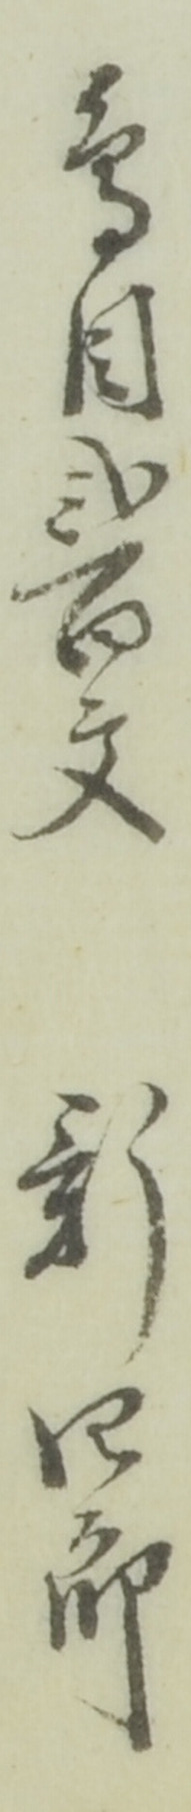鳥目弐百文新四郎
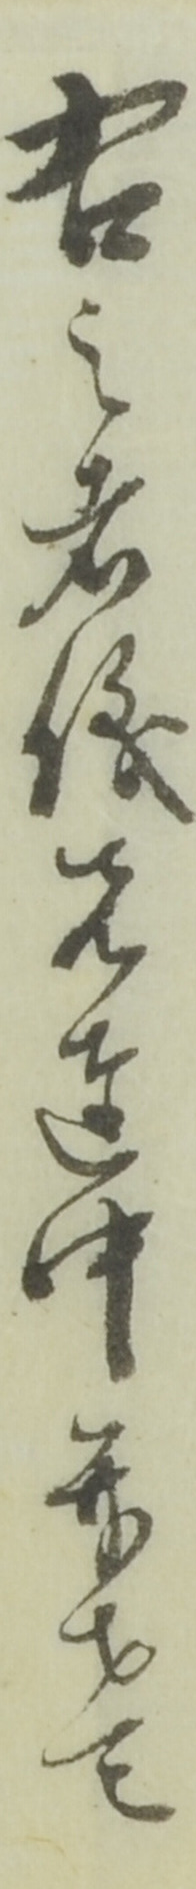右之者儀先達中弁才天
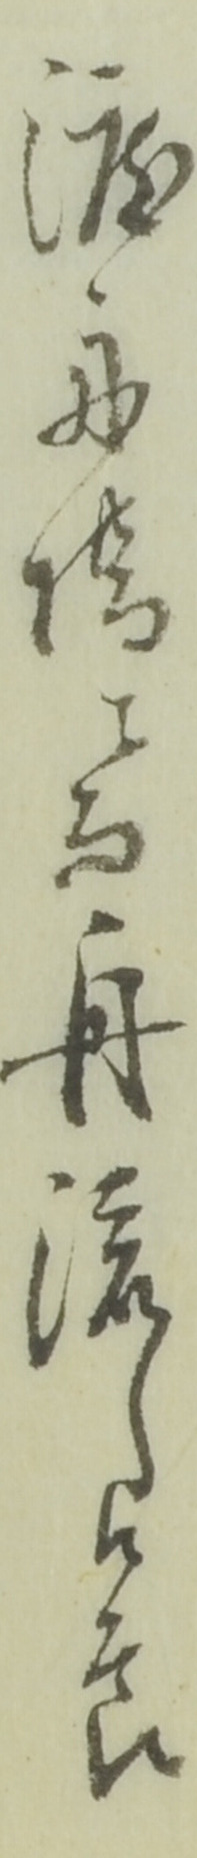渡舟場ニ而舟流し候節
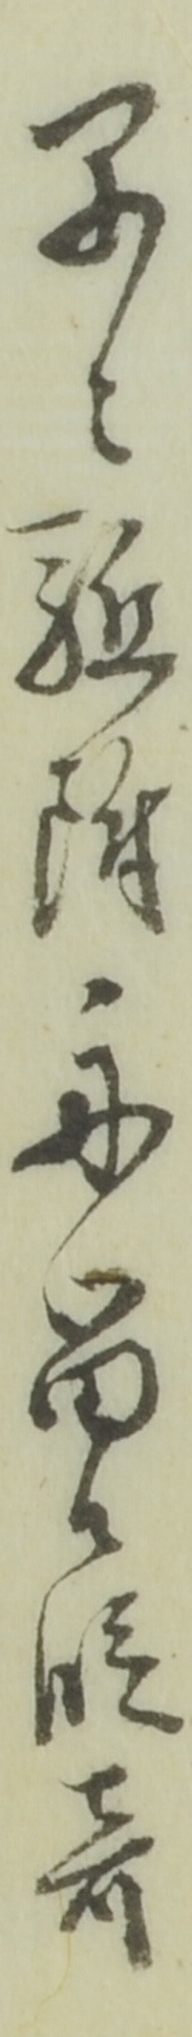早々駆附舟留候段奇
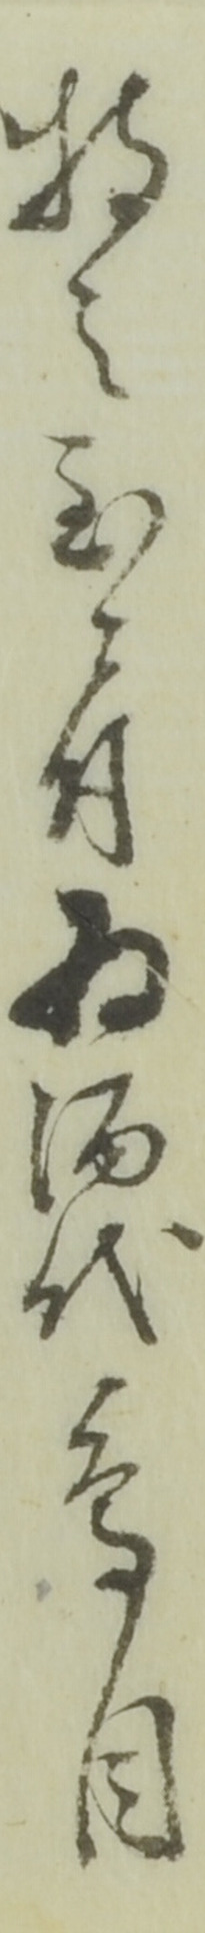特之至ニ付為酒代鳥目
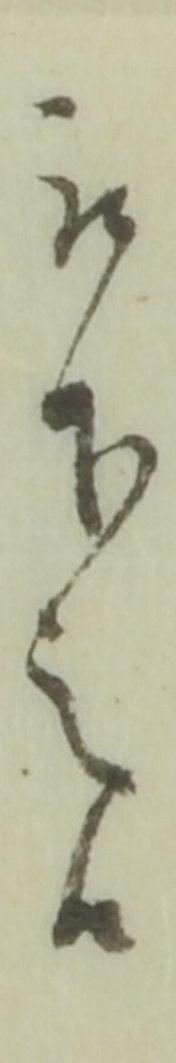被下之候
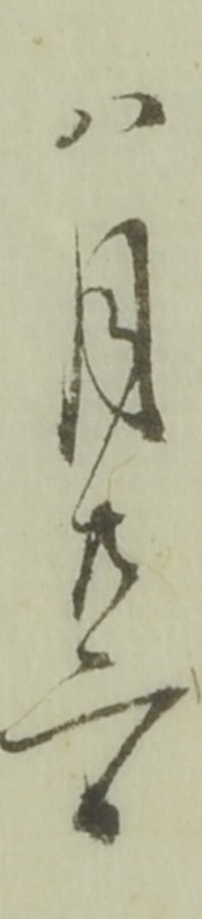八月廿二日
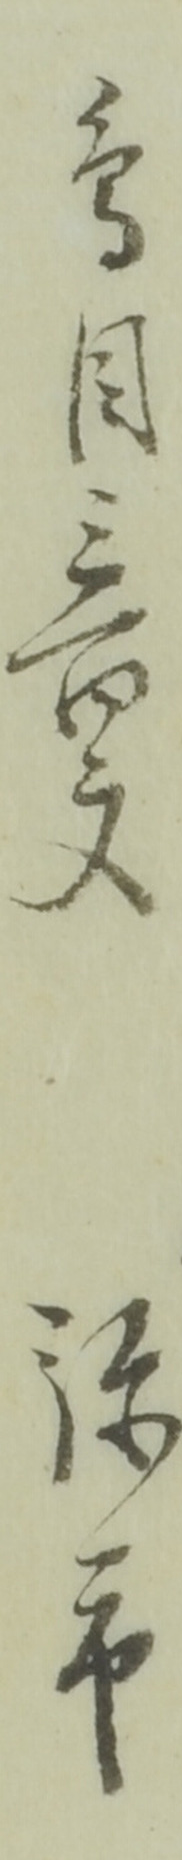鳥目三百文弥市
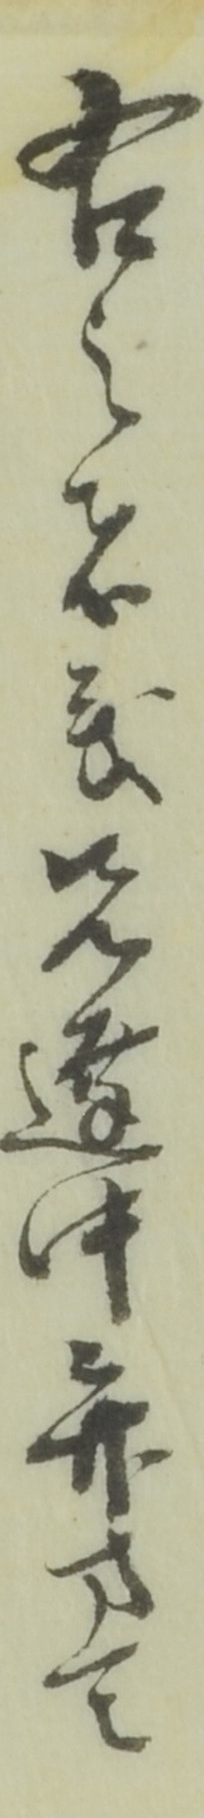右之者義先達中弁才天
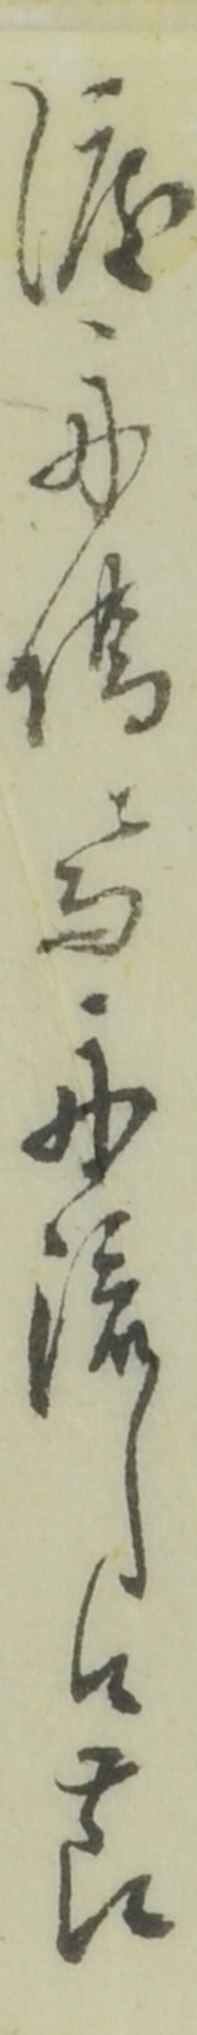渡舟場ニ而舟流し候節
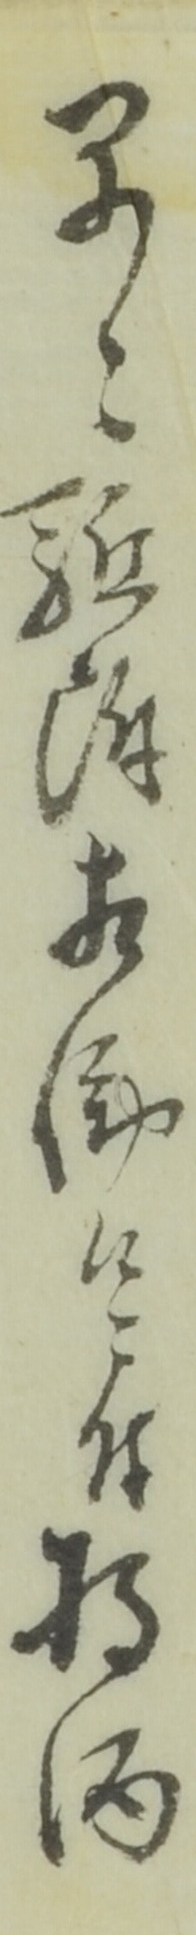早々駆附相働候ニ付持酒
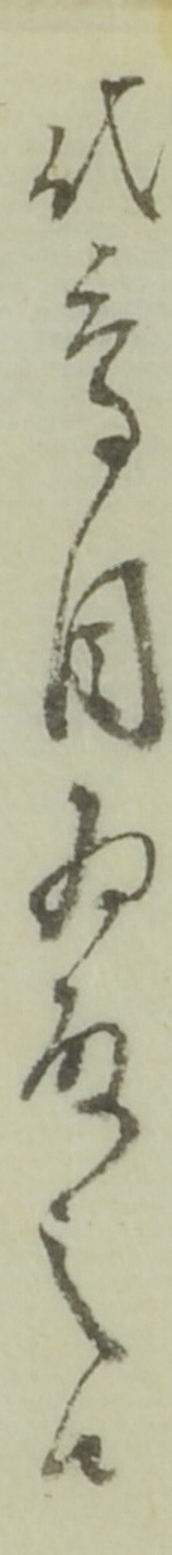代鳥目為取之候
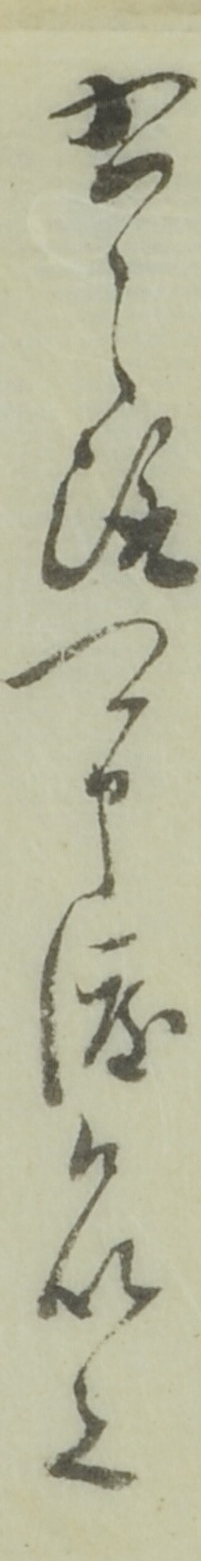右之趣可申渡候以上
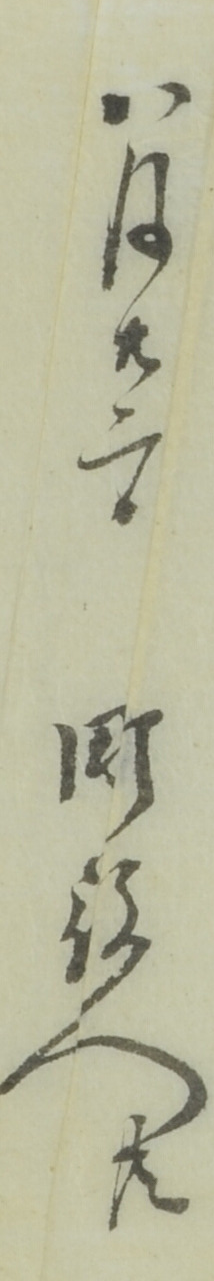八月廿二日町役人共

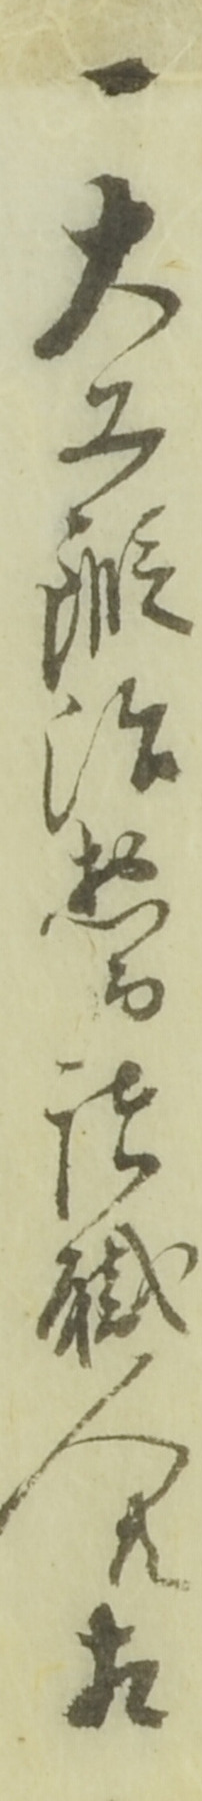一大工鍛治惣而諸職人共相
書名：御触書御書附控帳
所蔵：伊那市立高遠町図書館・合同会社AMANE
